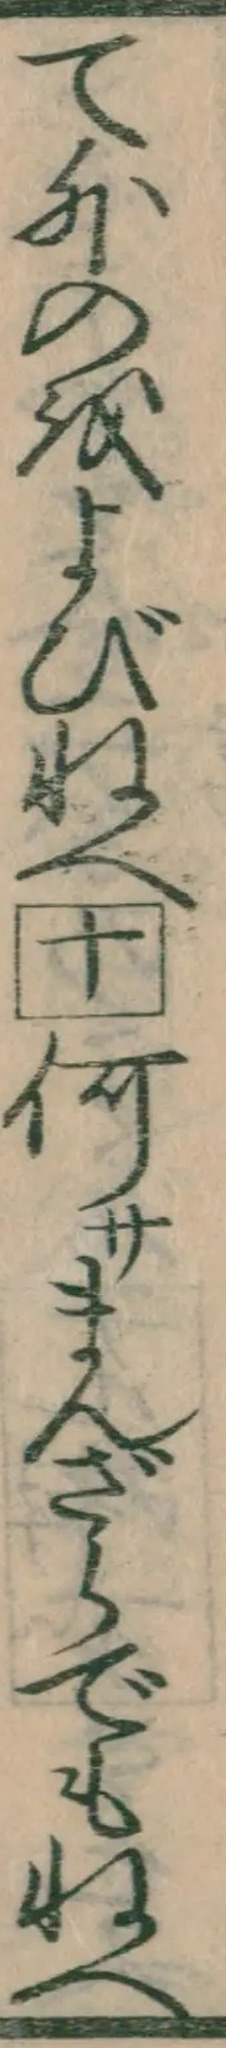て外のをよびねへ〈十〉何サまんざらでもねへ
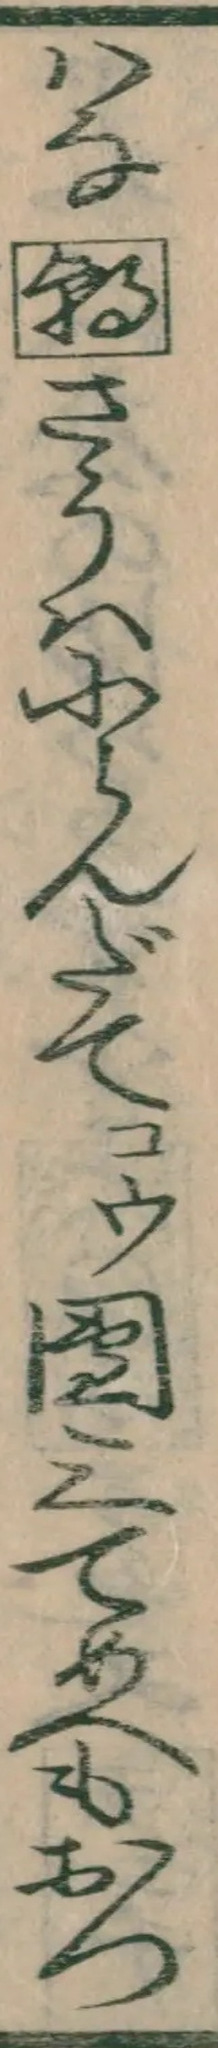はな〈朝〉さうはにらんだてコウ団三てめへもおつ
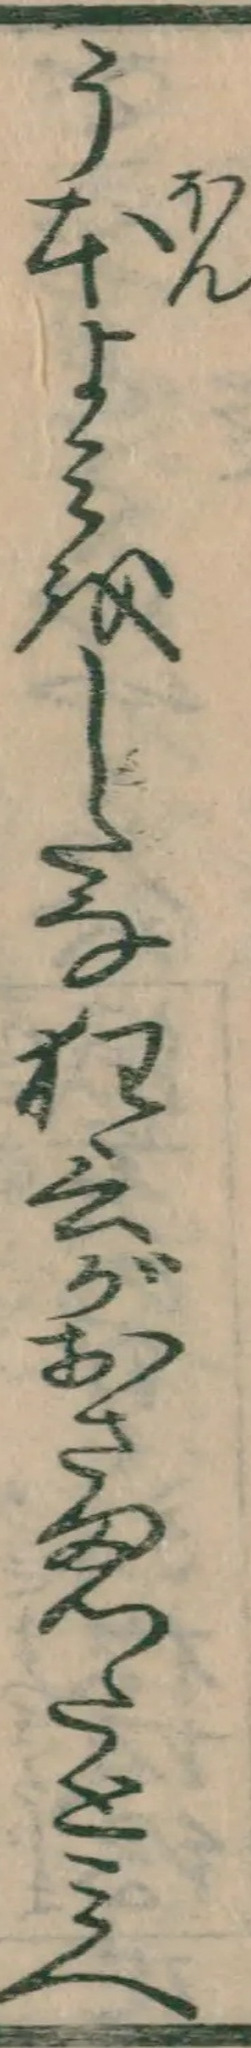う本よみをしたな狂言がおさまつたとみへ
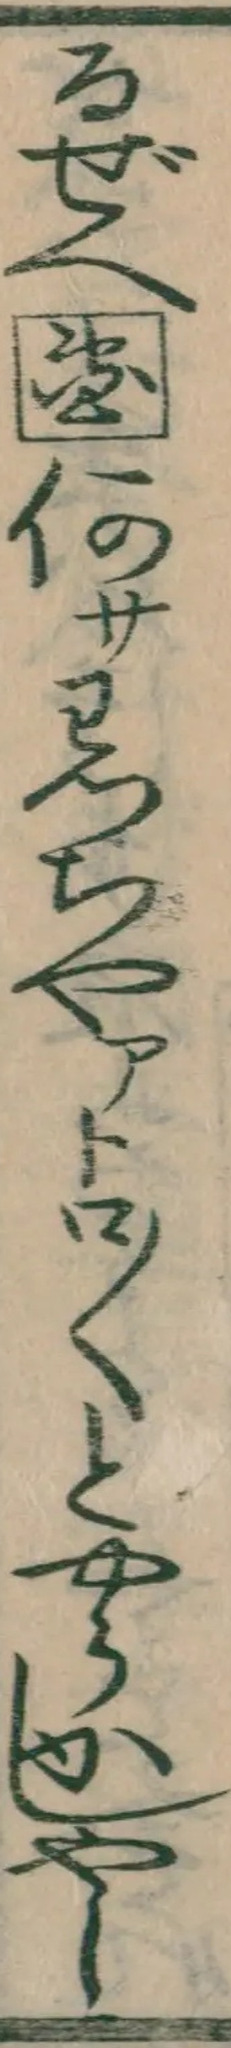るぜへ〈団〉何サわつちやァトロ〳〵とやうかしやし
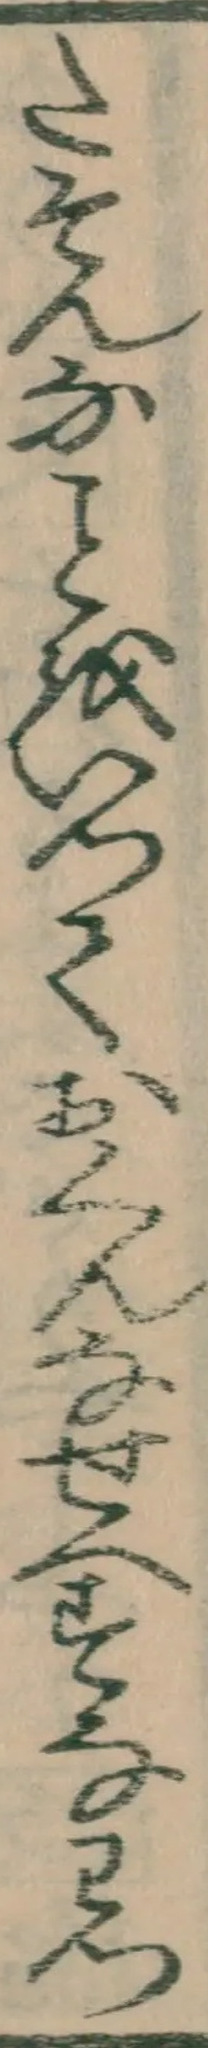たそんなことをいつておくんなせへすなわつ
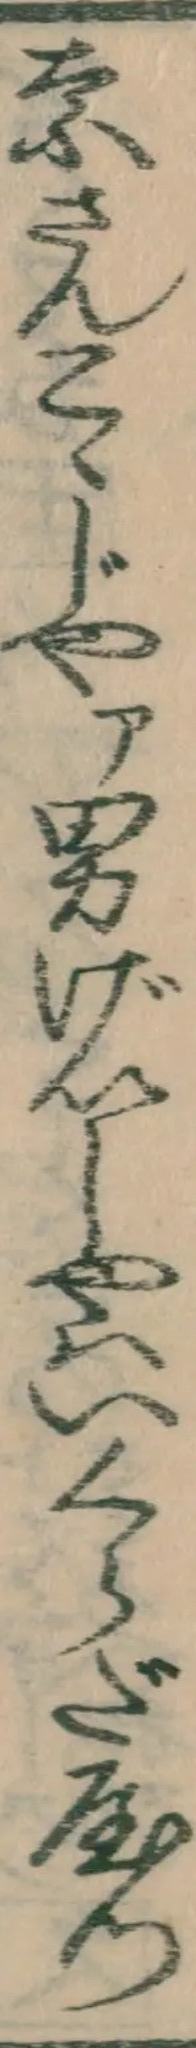奈さんこゝじやァ男げいしやはいくらだやつ
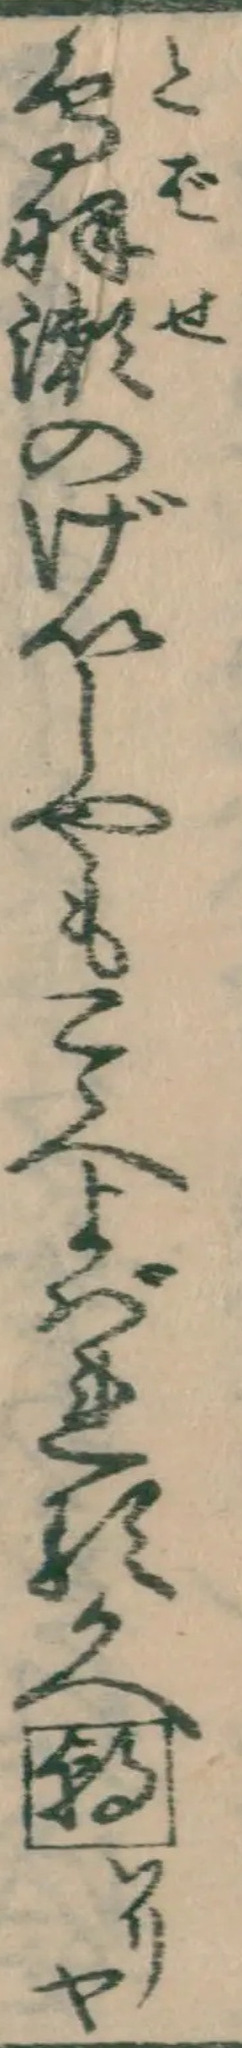鳥羽瀬のげいしやもこゝへよばれるかへ〈朝〉ソリヤ
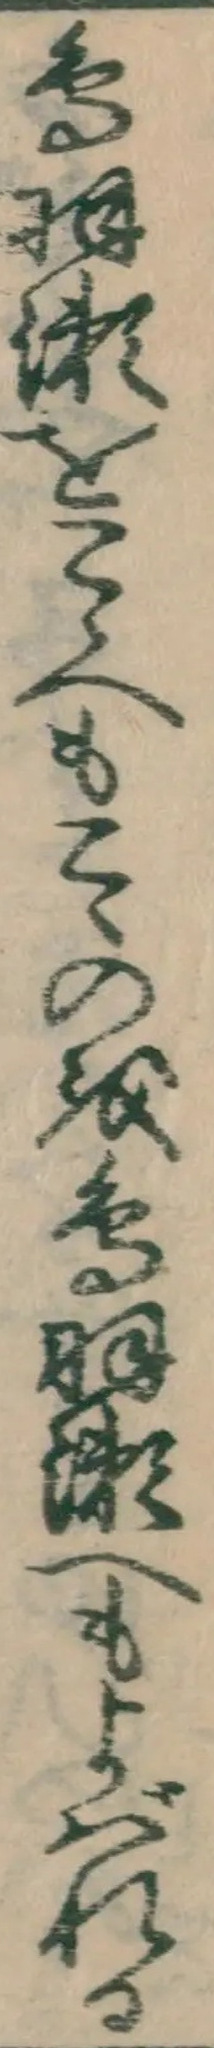鳥羽瀬をこゝへもこゝのを鳥羽瀬へもよばれる
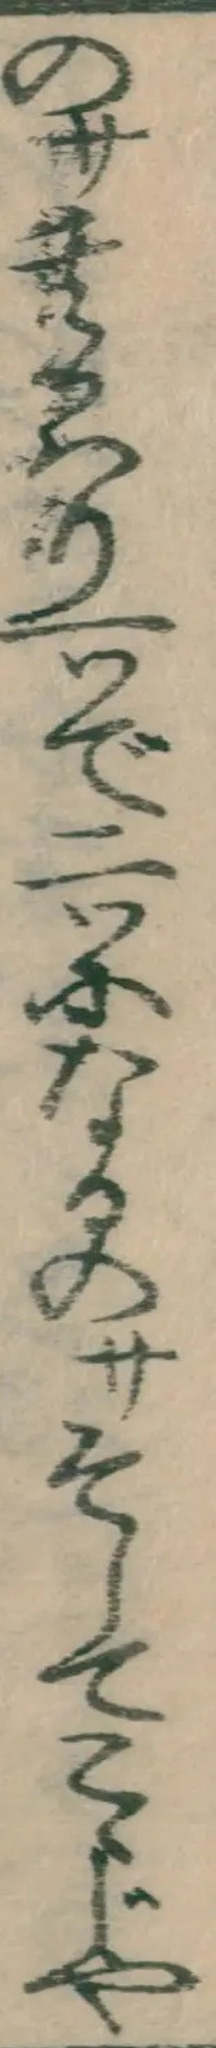のサ其かはり一ツで二ツになるのサそしてこゝじや
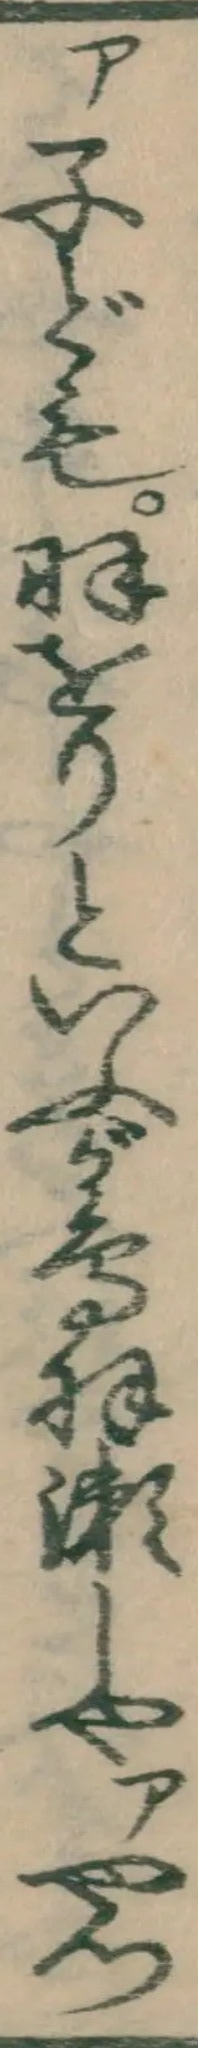ァ子ども。羽をりといふが鳥羽瀬しやァやつ

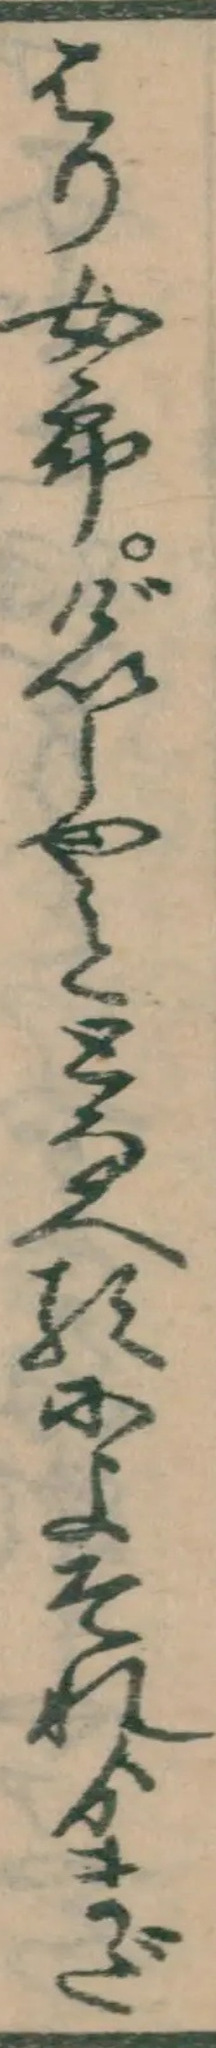はり女郎。げいしやとなへるによそれよりまだ
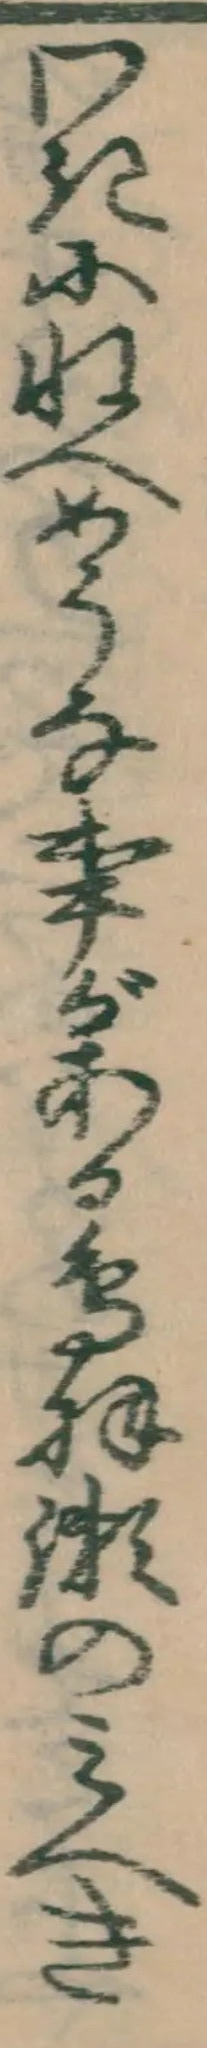わきにねへめうな事がある鳥羽瀬のみへき
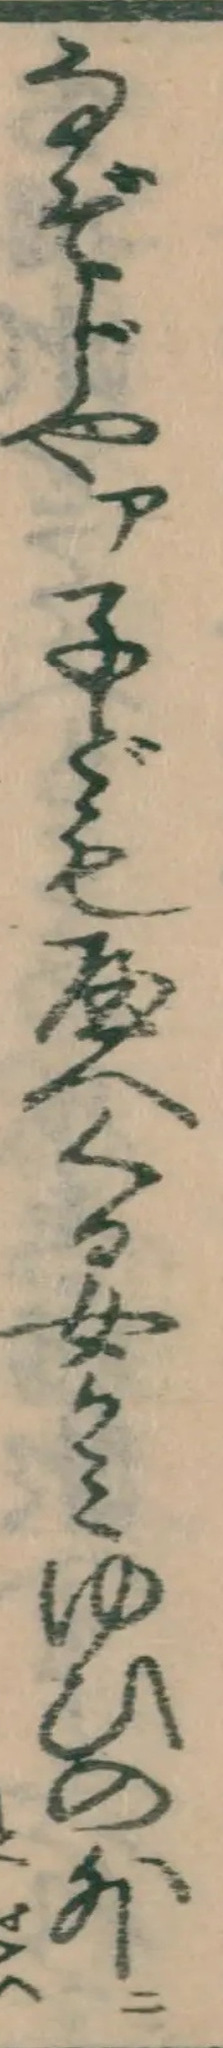なぞじやァ子ども屋へくる女かみゆひの外に
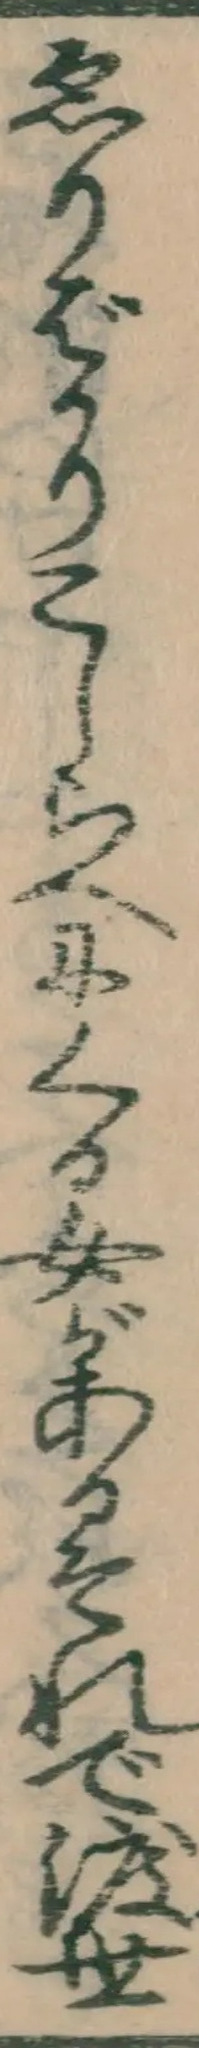ゑりばかりこしらへにくる女があるそれで渡世
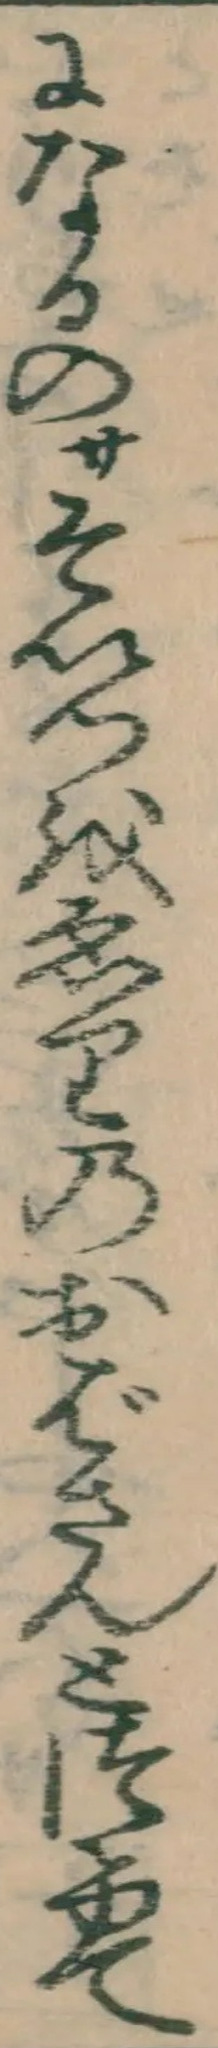になるのサそいつをゑりのおばさんとつけて
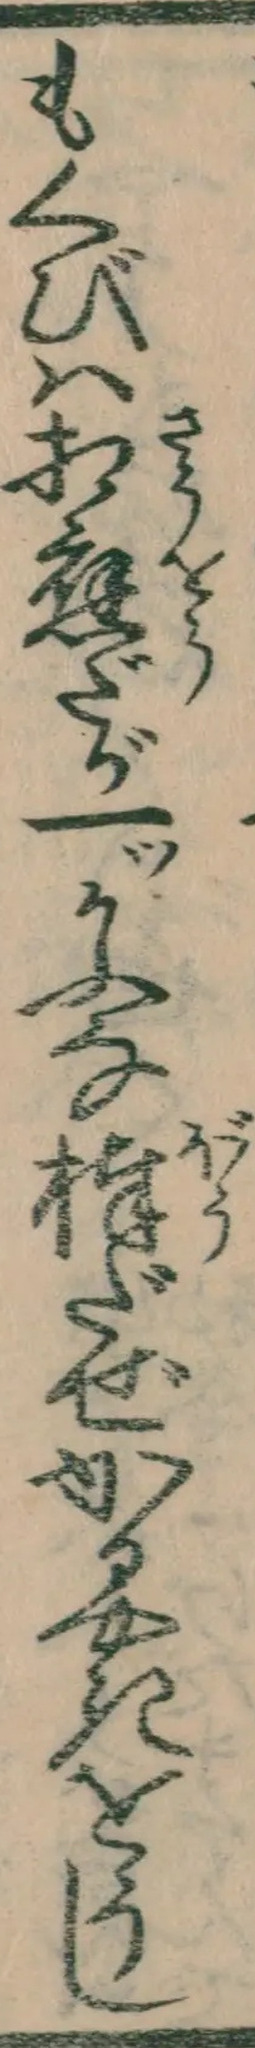もくびは相応だが一ッかふな棒だぜかるやきをうし
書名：教訓読本：大礒風俗仕懸文庫
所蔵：国立国会図書館 National Diet Library, JAPAN
